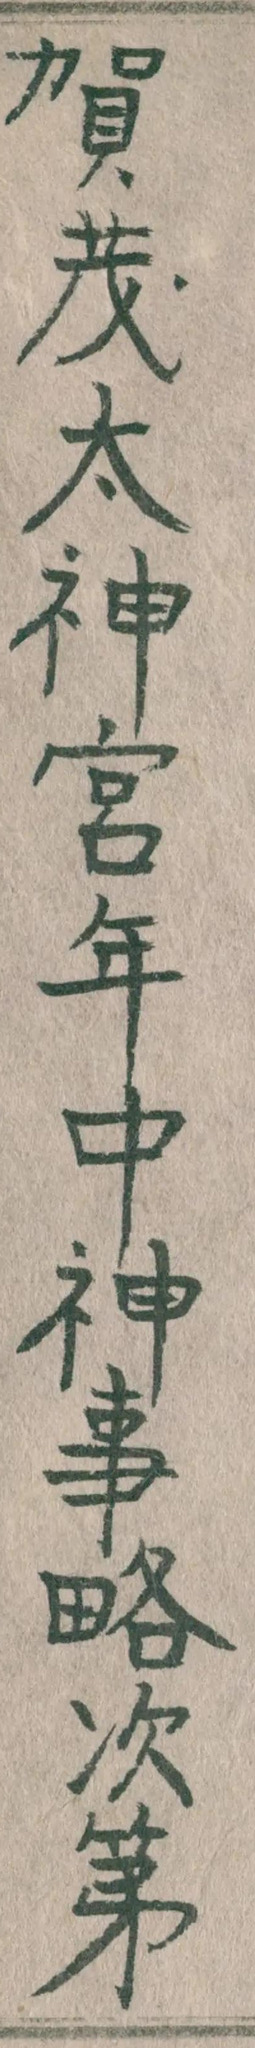賀茂太神宮年中神事略次第

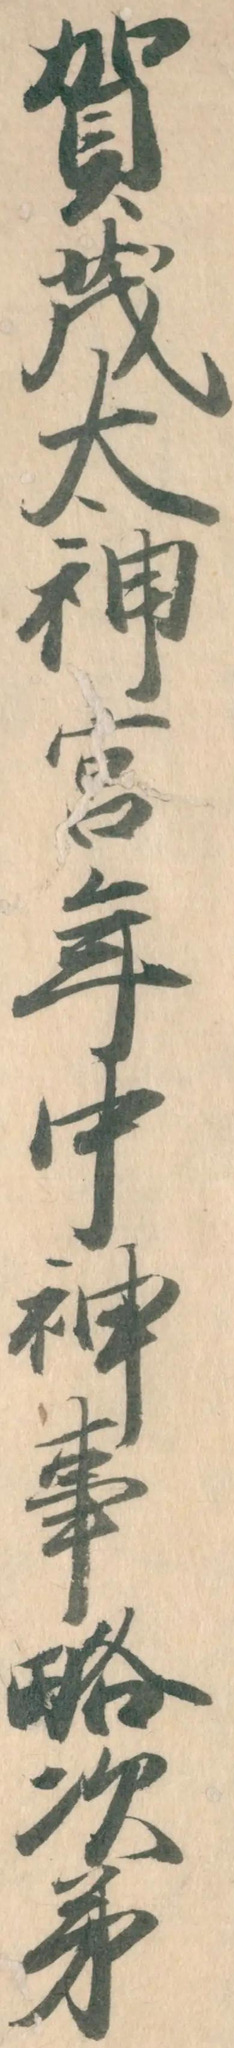賀茂太神宮年中神事略次第

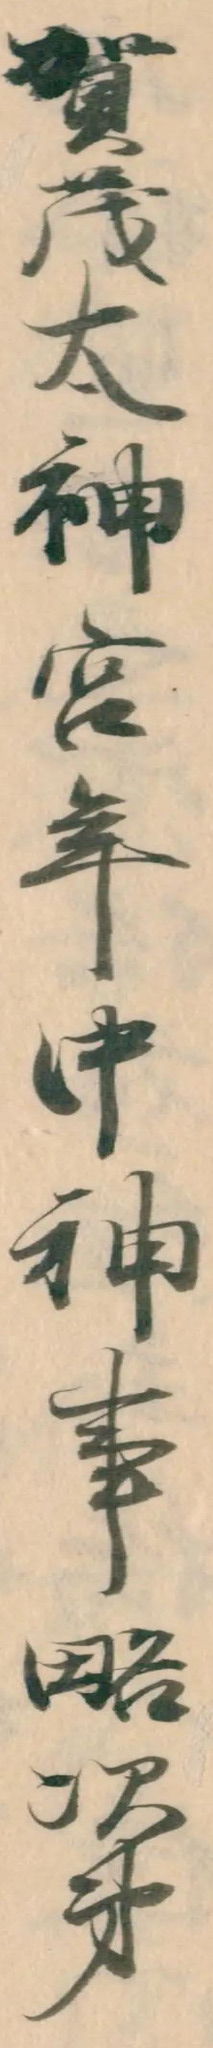賀茂太神宮年中神事略次第
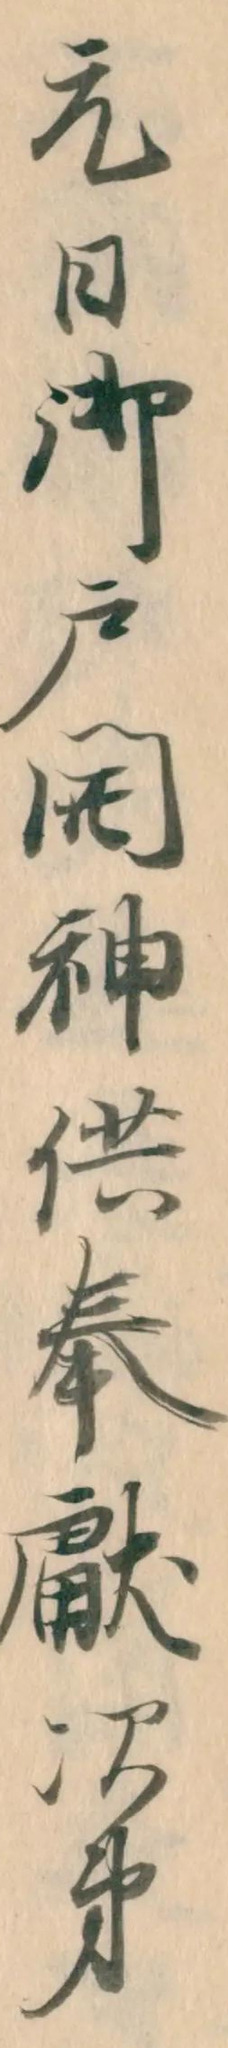元日御戸開神供奉獻次第
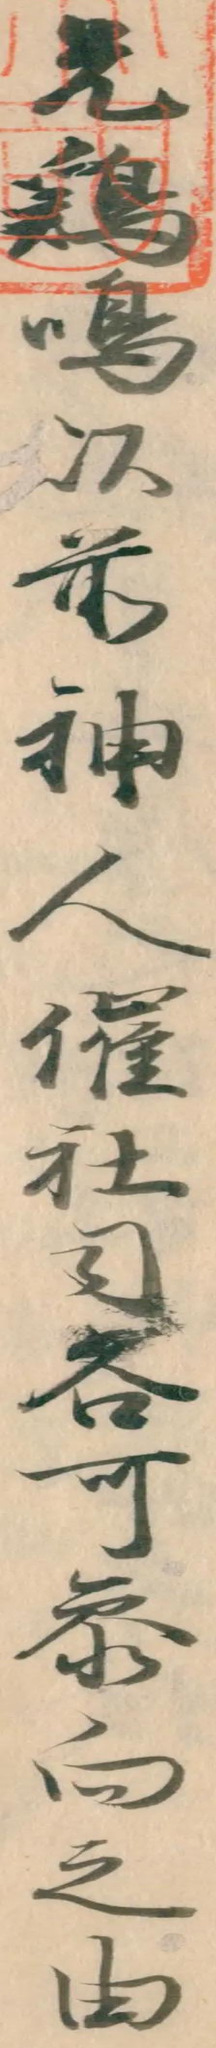先鶏鳴以前神人催社司各可参向之由
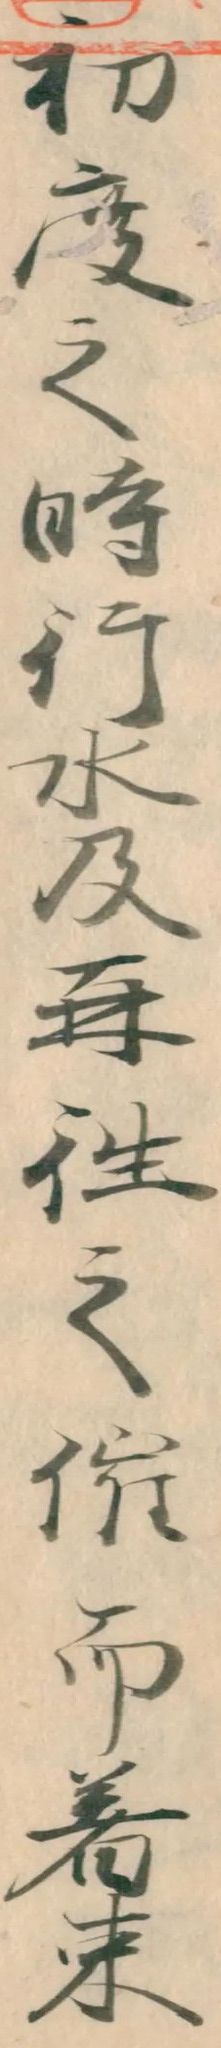初度之時行水及再往之催而着束
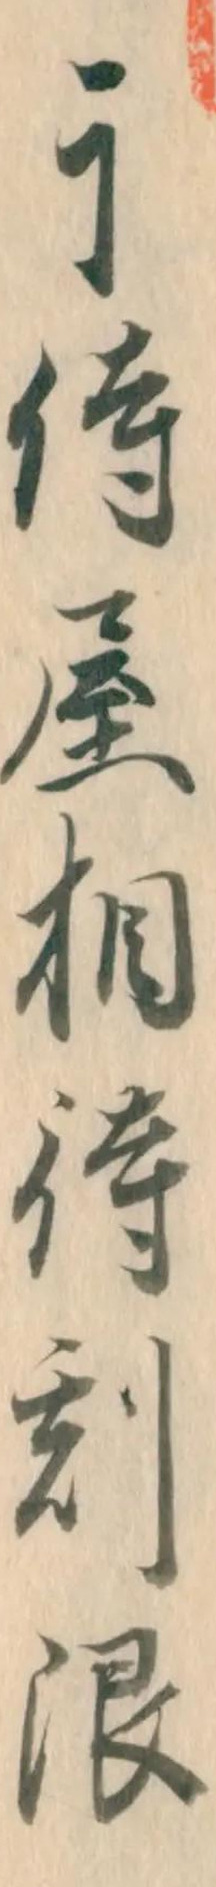于侍屋相待刻限
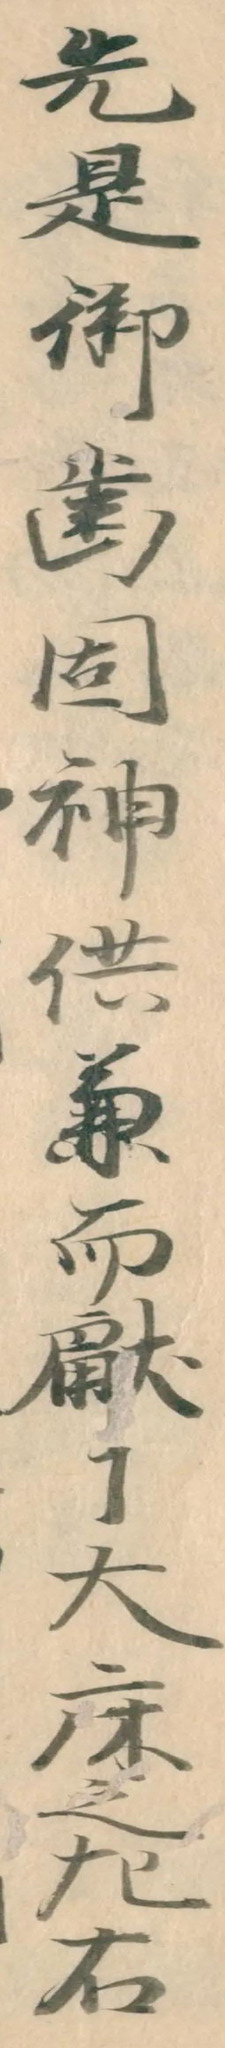先是御歯固神供兼而獻于大床之左右
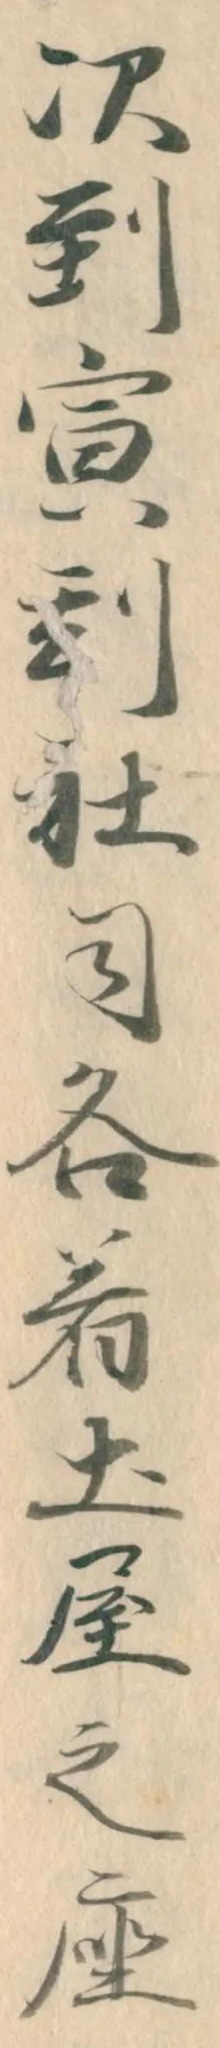次到寅刻社司各着土屋之座

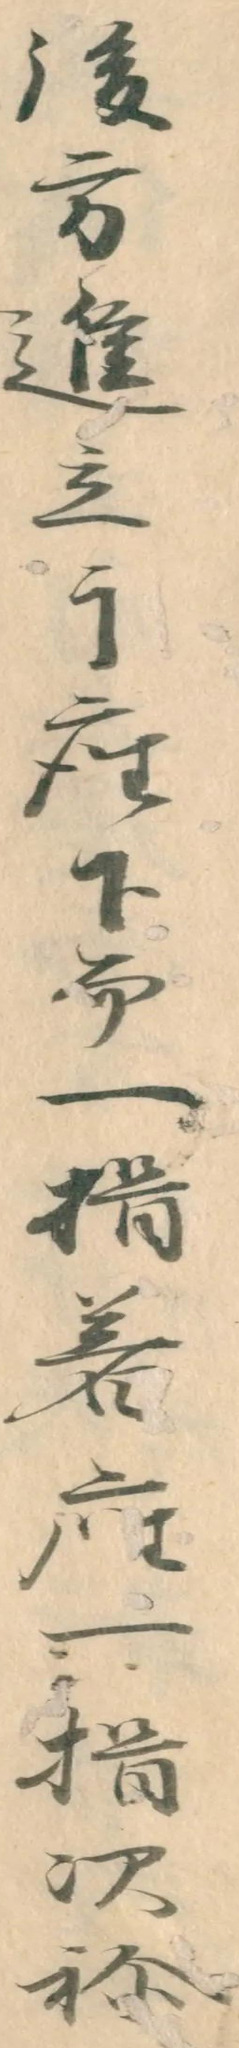後方進立于座下而一揖着座一揖次禰
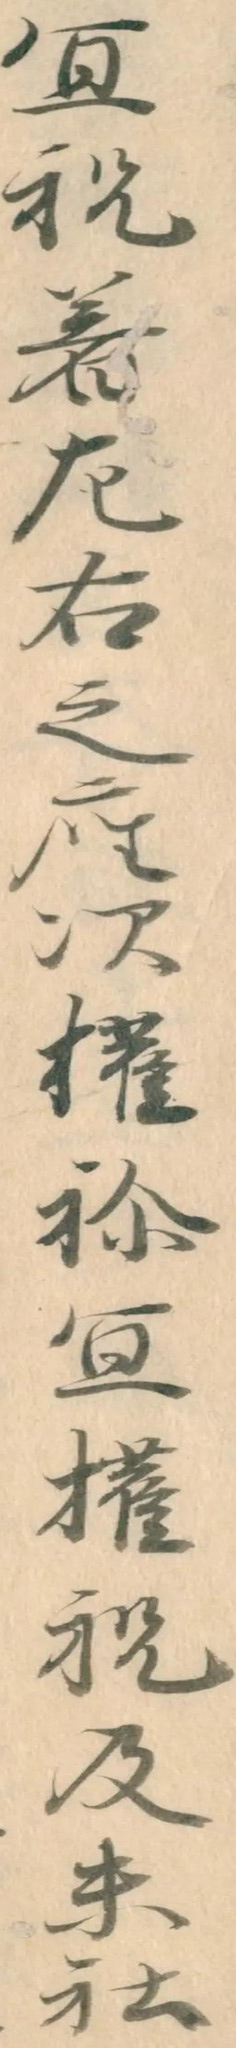宜祝着左右之座次権禰宜権祝及末社
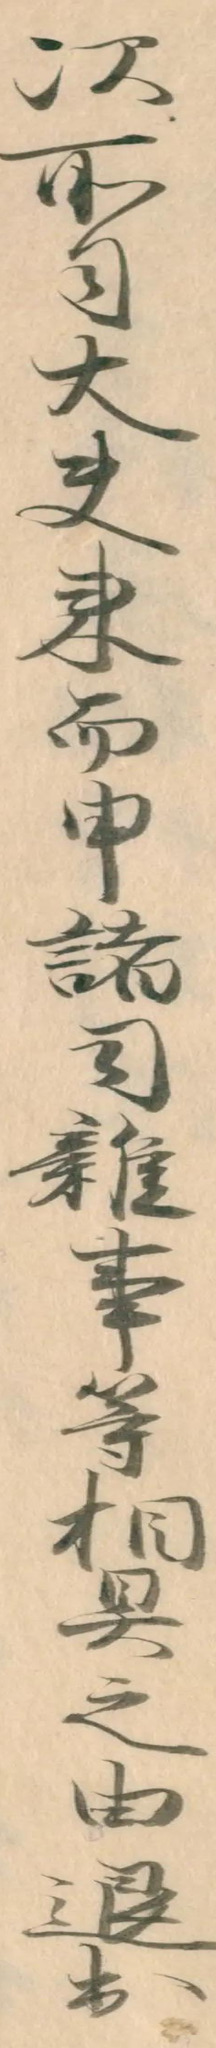次所司大夫来而申諸司雑事等相具之由退出
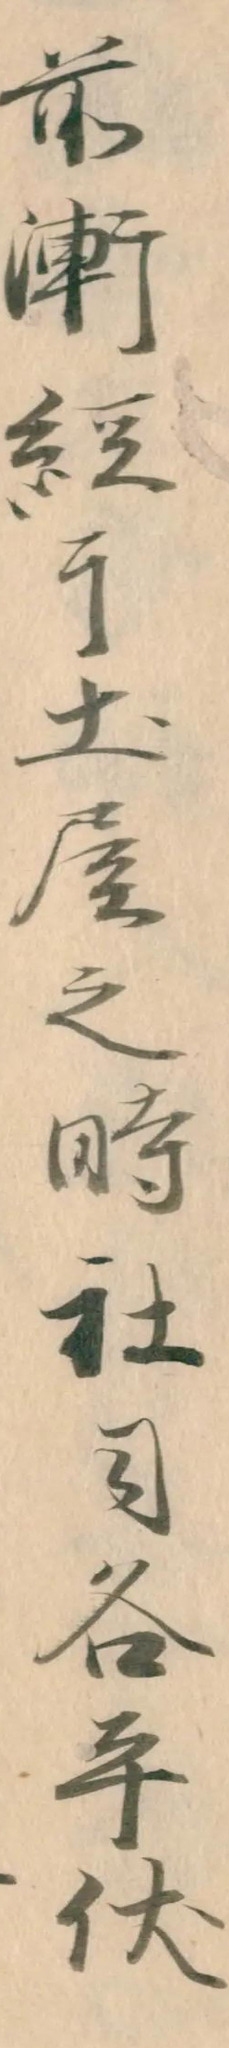前漸経于土屋之時社司各平伏
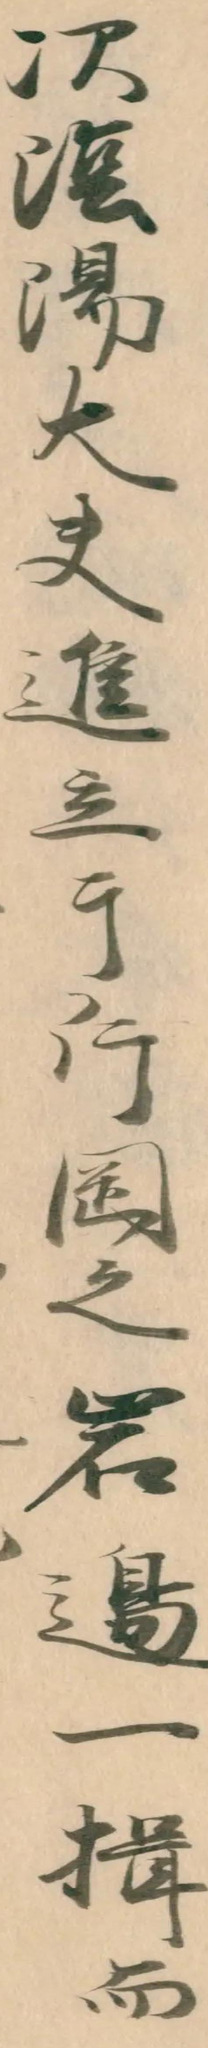次陰陽大夫進立于片岡之岩辺一揖而
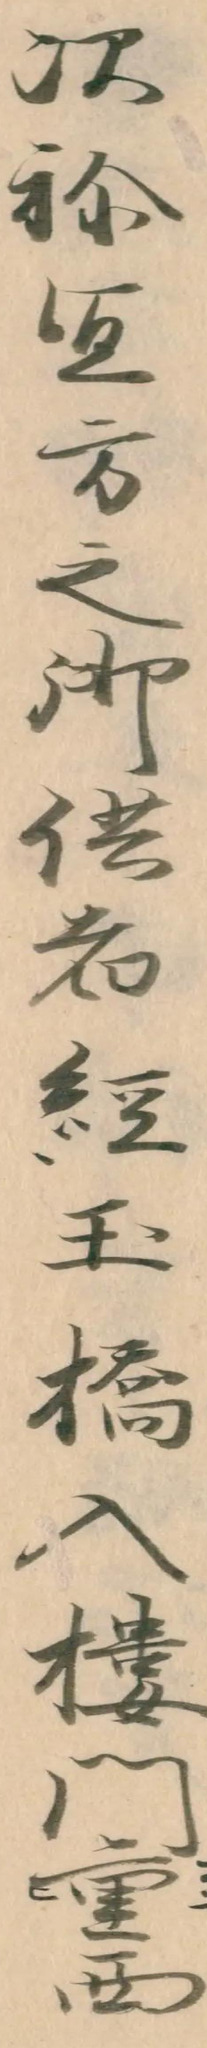次禰宜方之御供者経玉橋入楼門重西
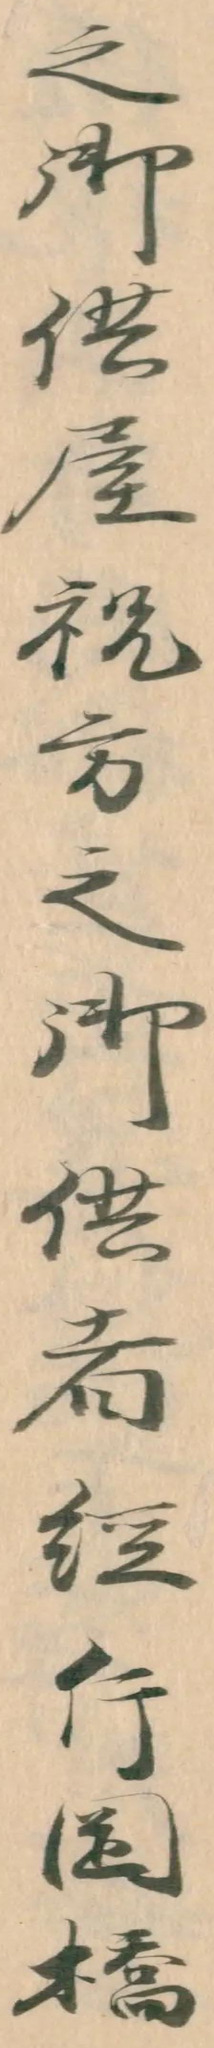之御供屋祝方之御供者經行岡橋
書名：賀茂太神宮年中神事略次第
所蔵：国立国会図書館 National Diet Library, JAPAN
